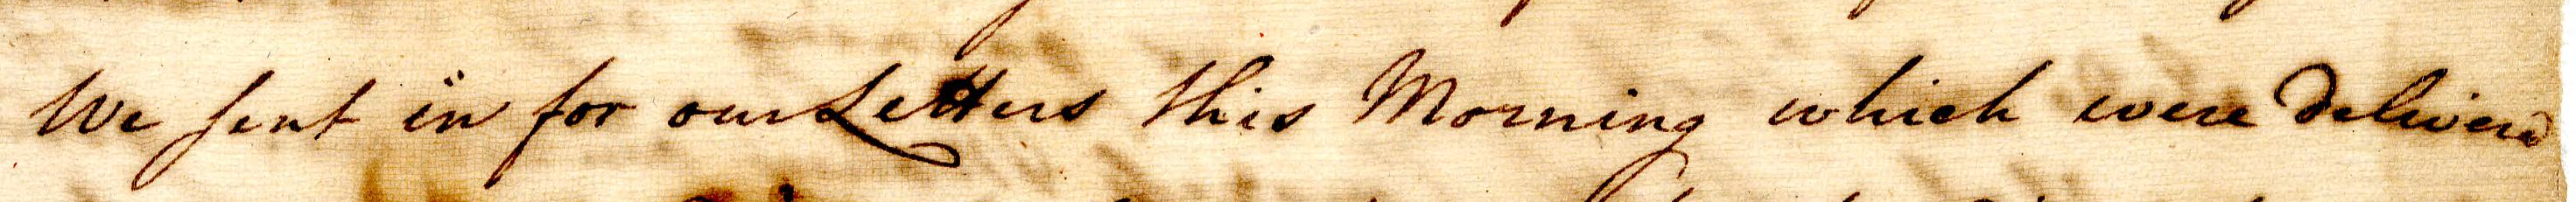We sent in for our Letters this Morning which were delivered
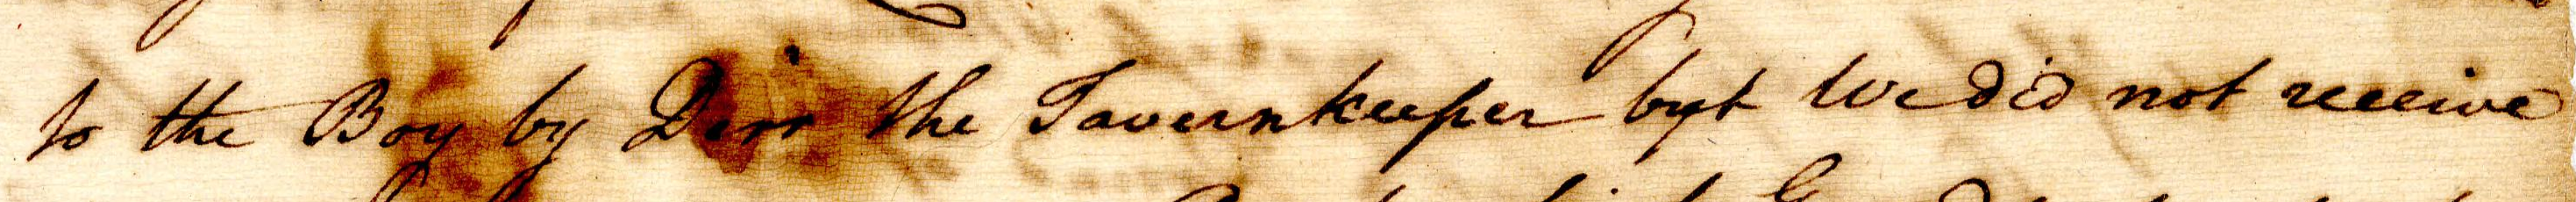to the Boy by Dir the Tavernkeeper but We did not receive
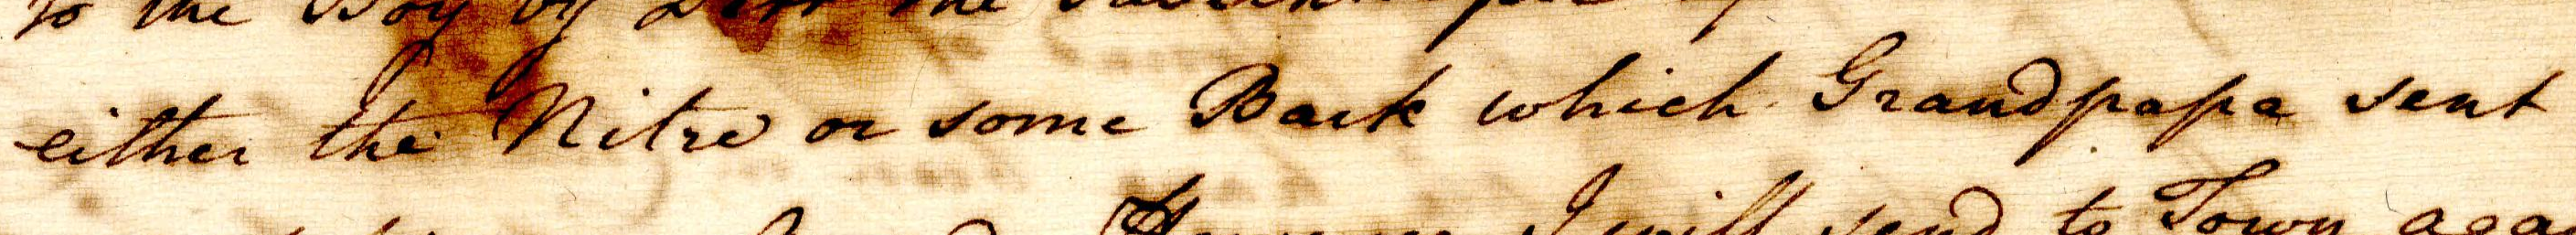either the Nitre or some Bark which Grandpapa sent
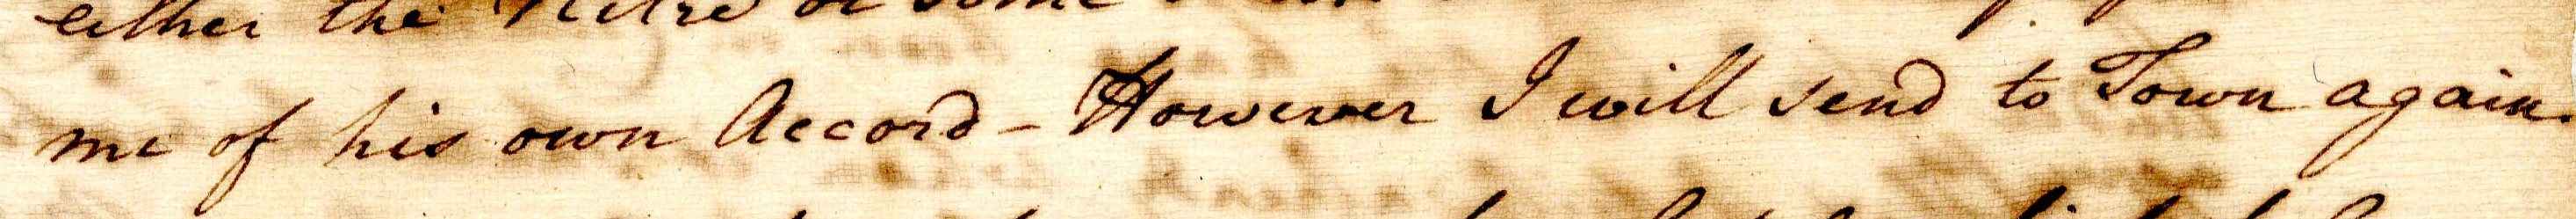me of his own Accord- However I will send to Town again.
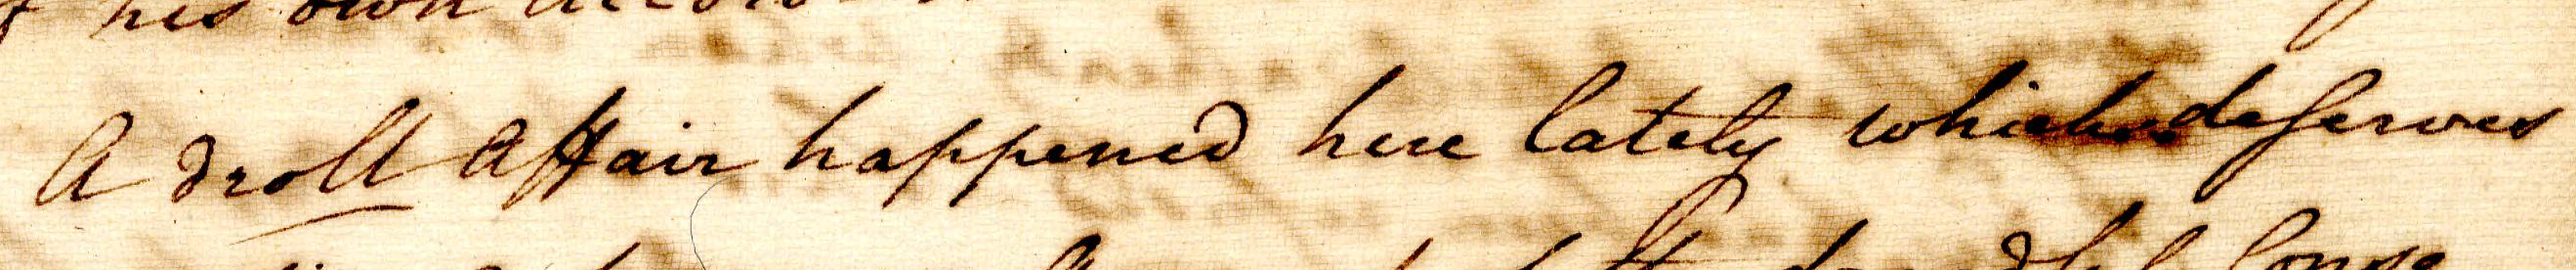A droll affair happened here lately which deserves
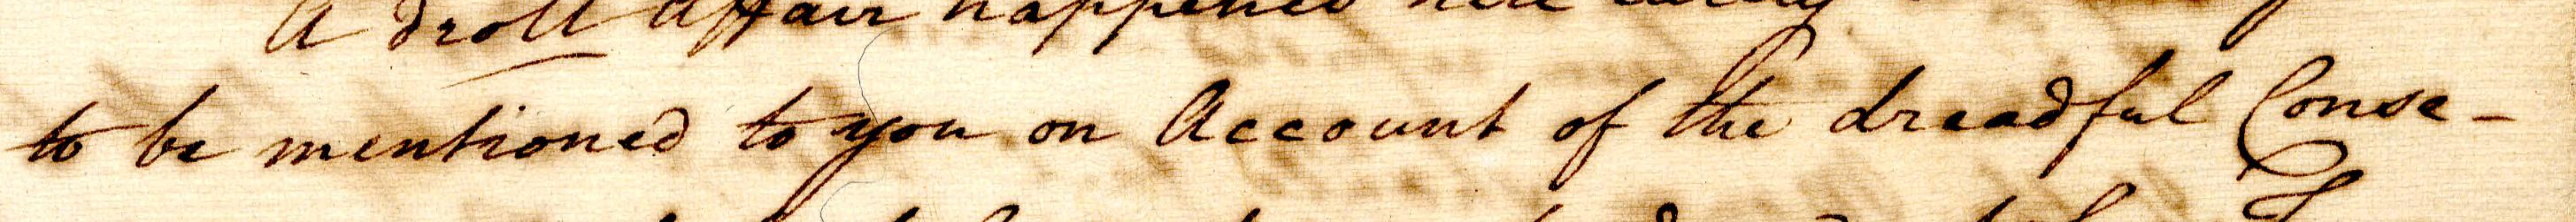to be mentioned to you on Account of the dreadful Conse-
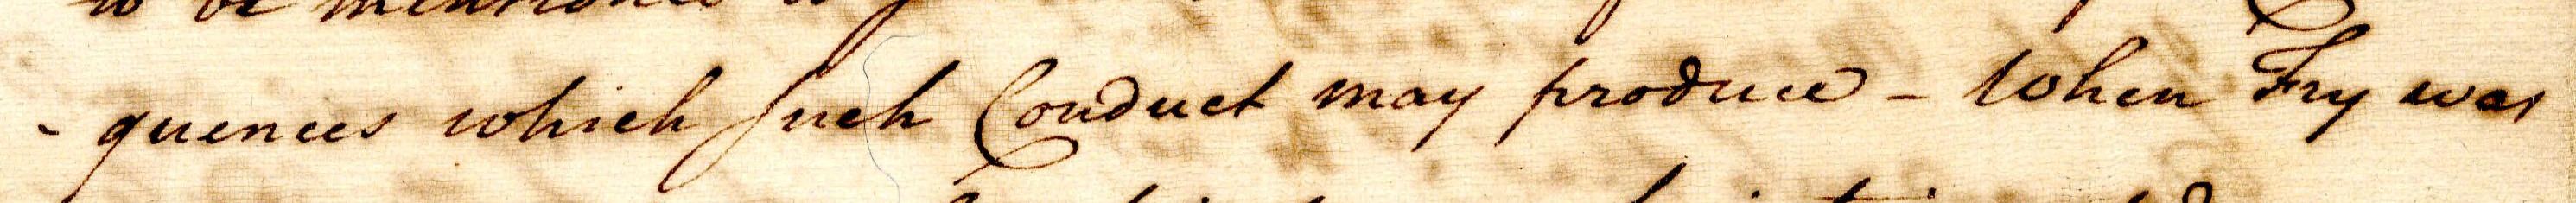-quences which such Conduct may produce- when Fry was
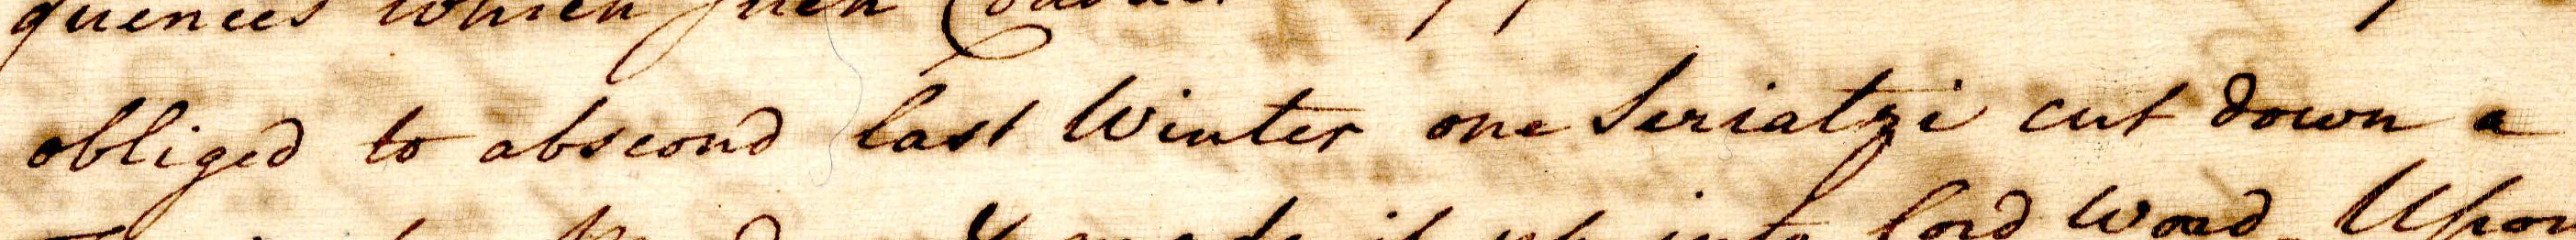obliged to abscond last Winter one Seriatze cut down a
